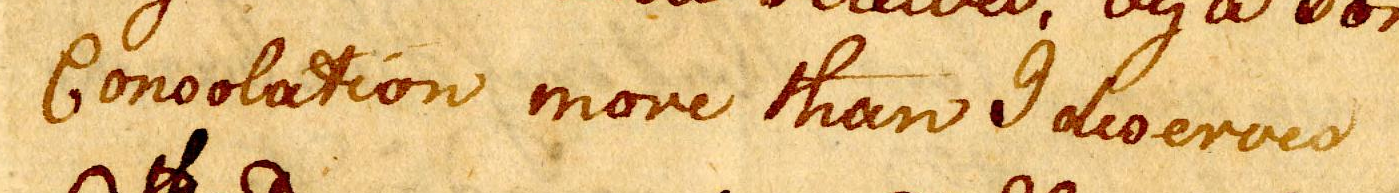Consolation more than I deserved
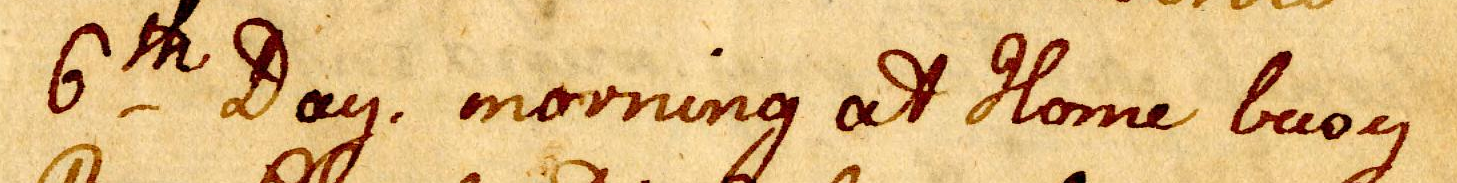6^th Day. morning at Home busy
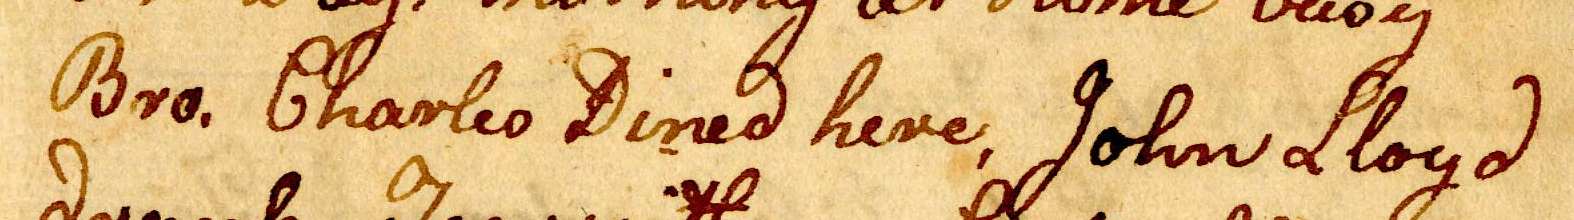Bro. Charles Dined here, John Lloyd
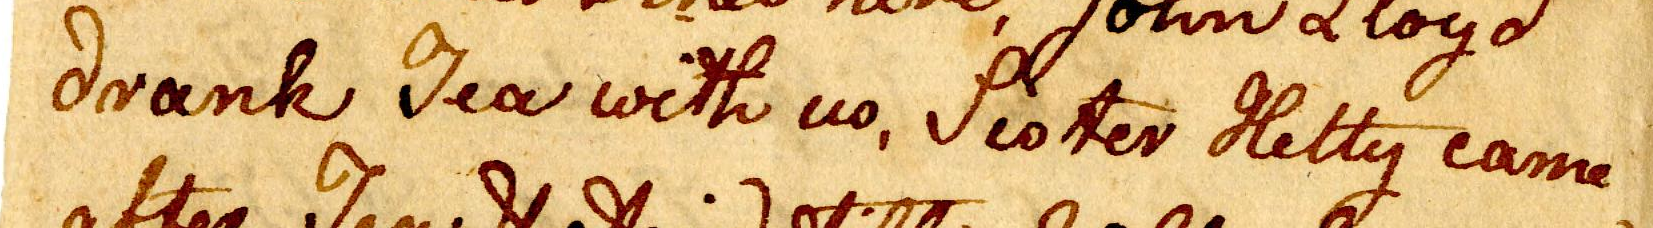drank Tea with us, Sister Hetty came
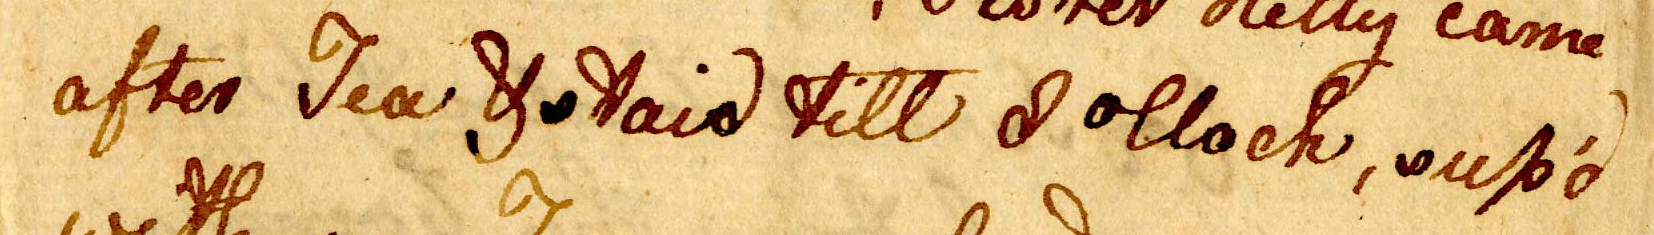after Tea & staid till 8 ^o Clock, sup'd
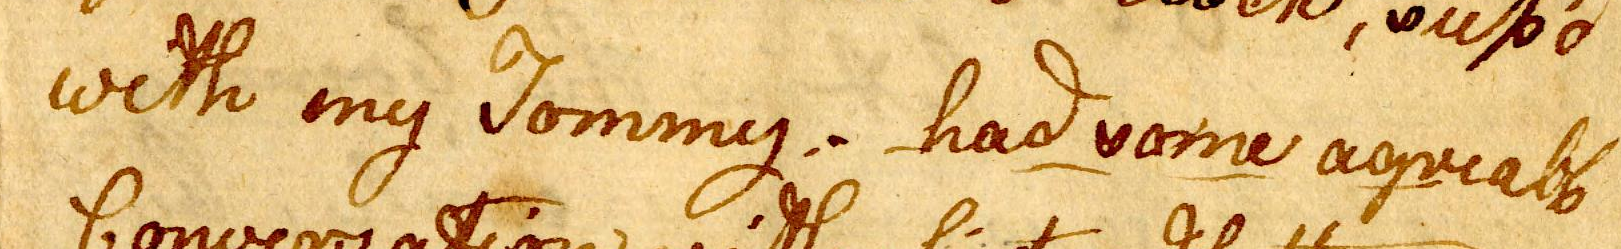with my Tommy. had some agreable
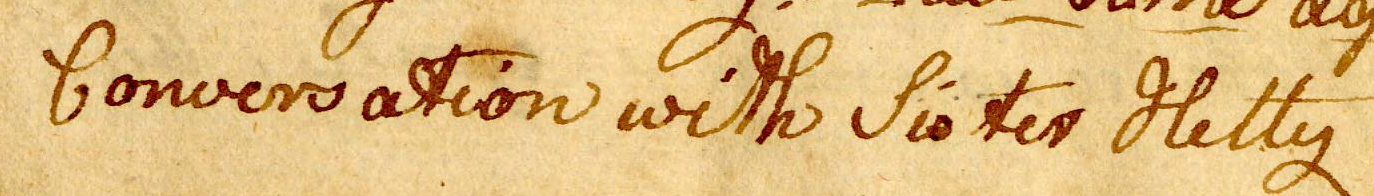Conversation with Sister Hetty
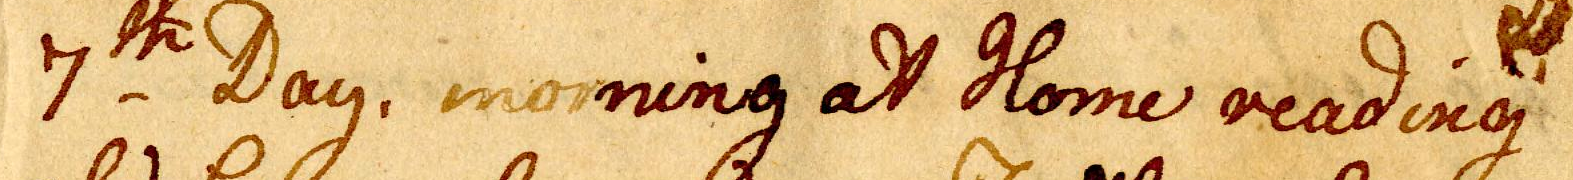7^th Day. morning at Home reading
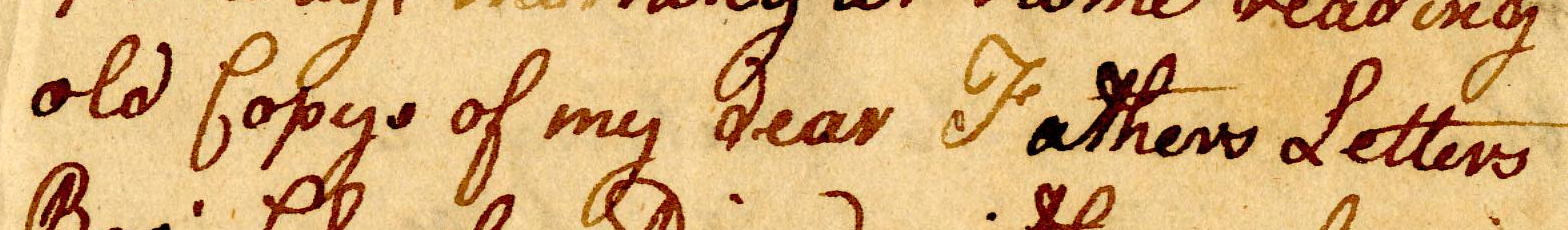old Copys of my dear Fathers Letters
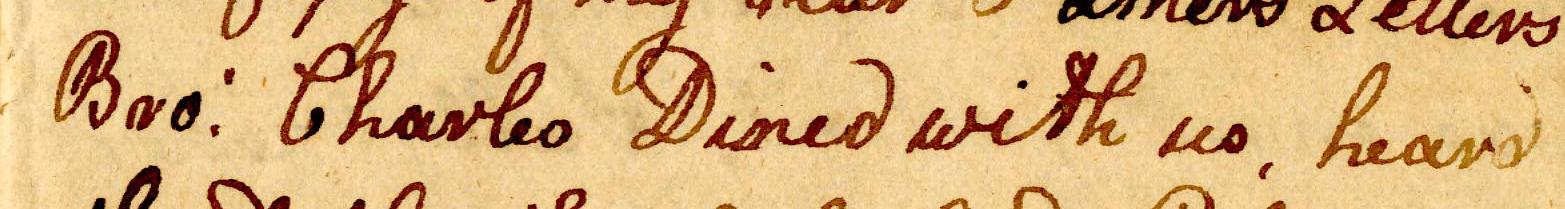Bro: Charles Dined with us, heard
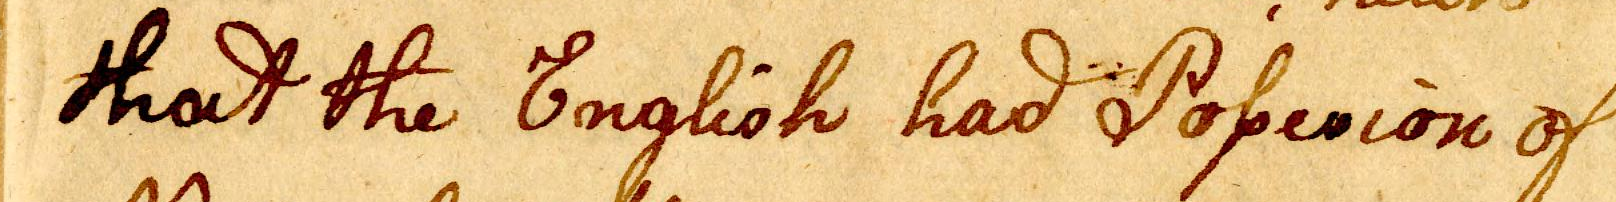that the English had Possesion of
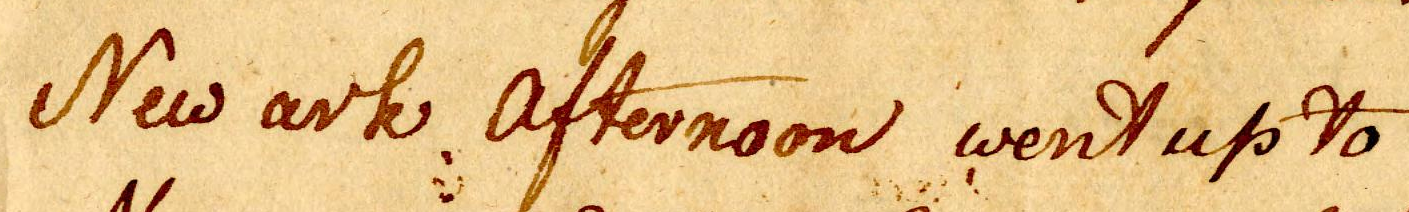New ark Afternoon went up to
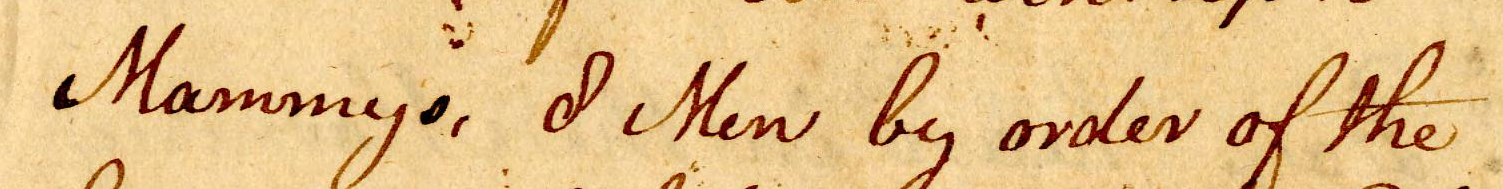Mammys, 8 Men by order of the
